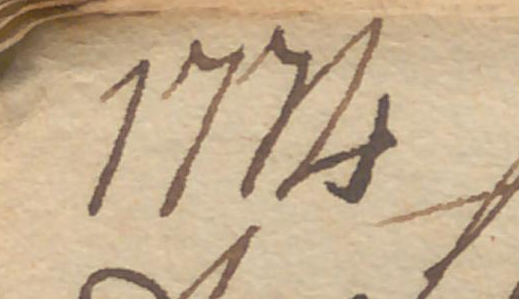1774
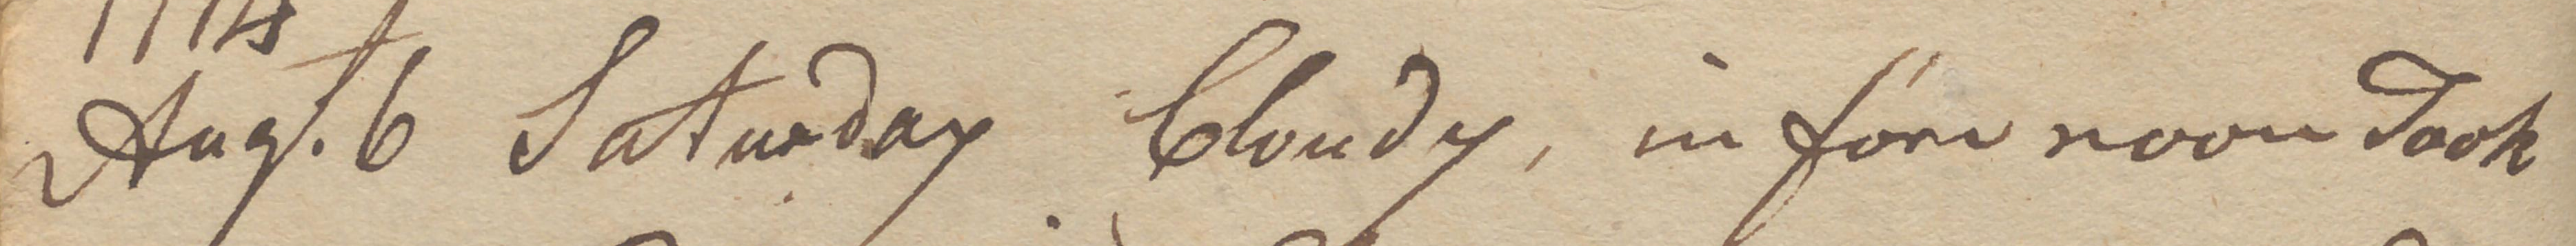Aug^t. 6 Saturday Cloudy, in fore noon Took
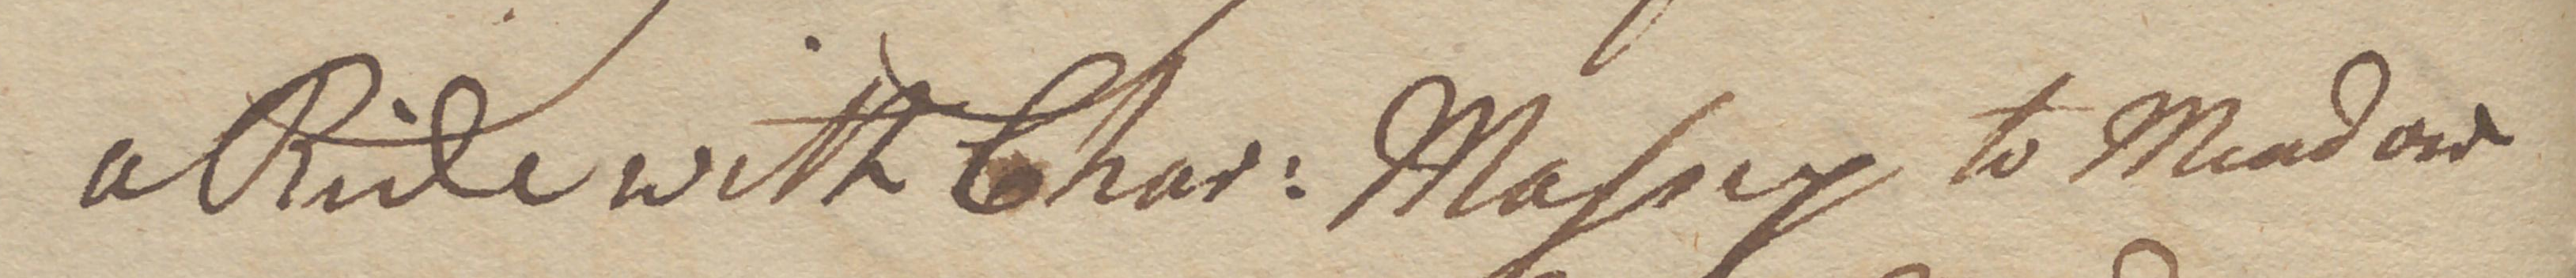a Ride with Char: Massey to Meadow
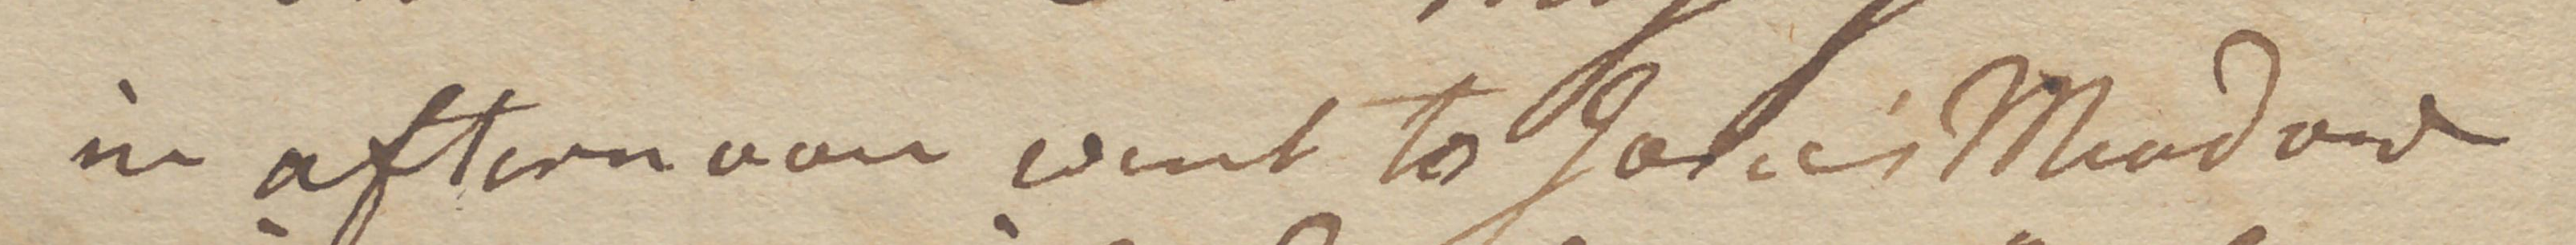in afternoon went to Jone's Meadow
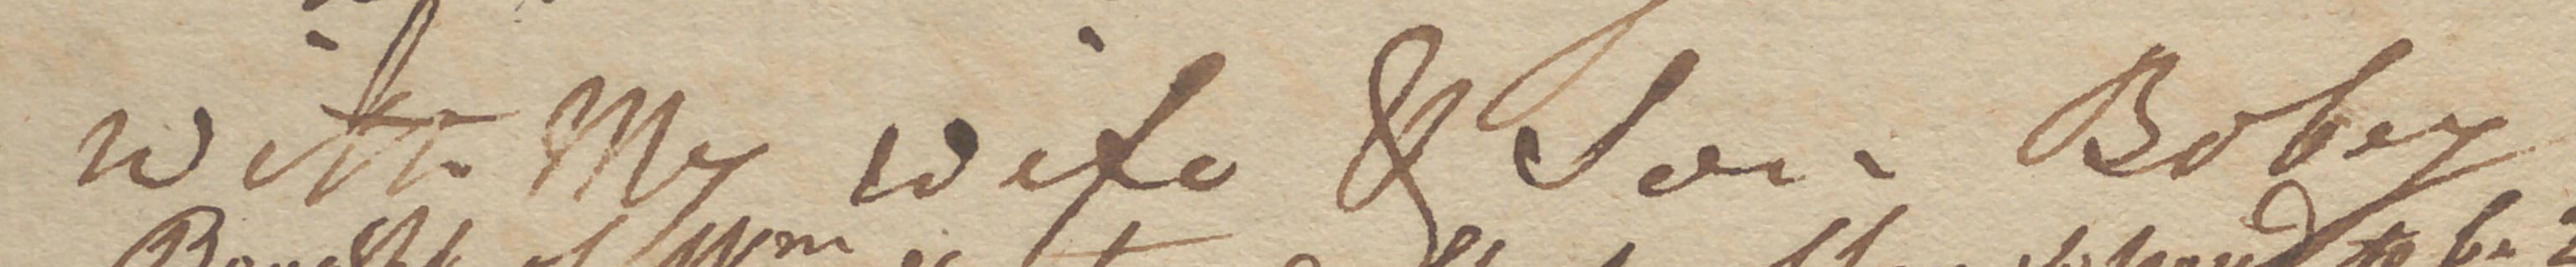with My wife, & Son. Bobey
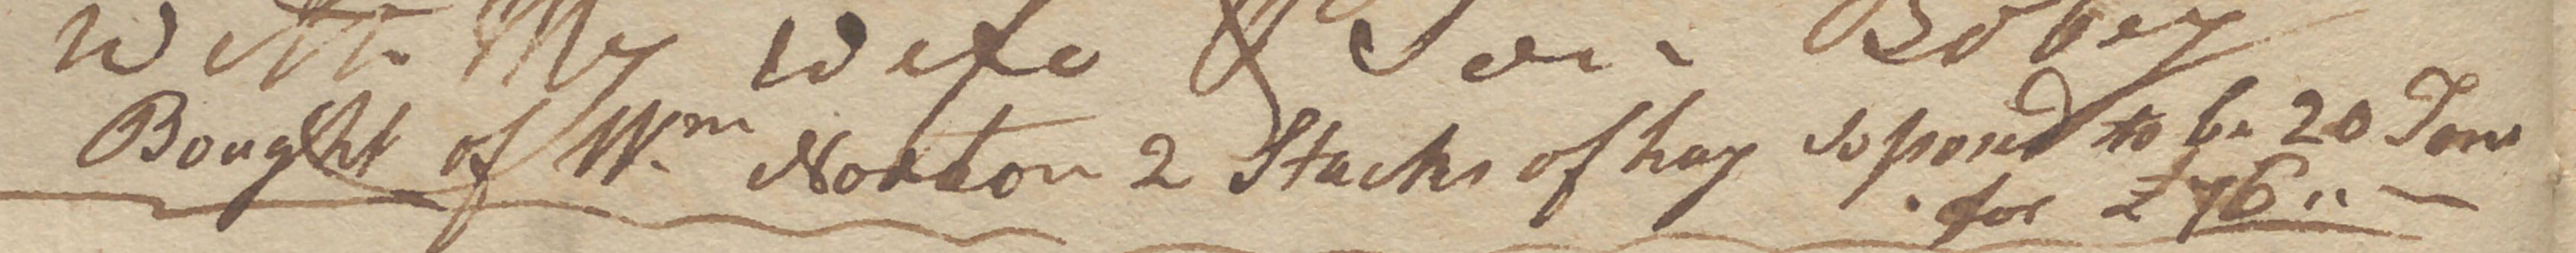Bought of W^m. Norton 2 Stacks of hay soposed to be 20 Ton
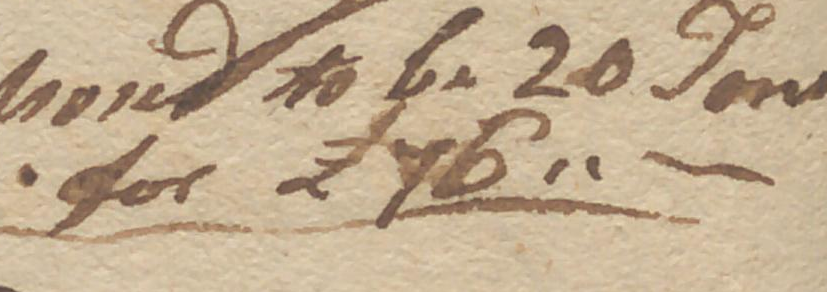for £76..-
